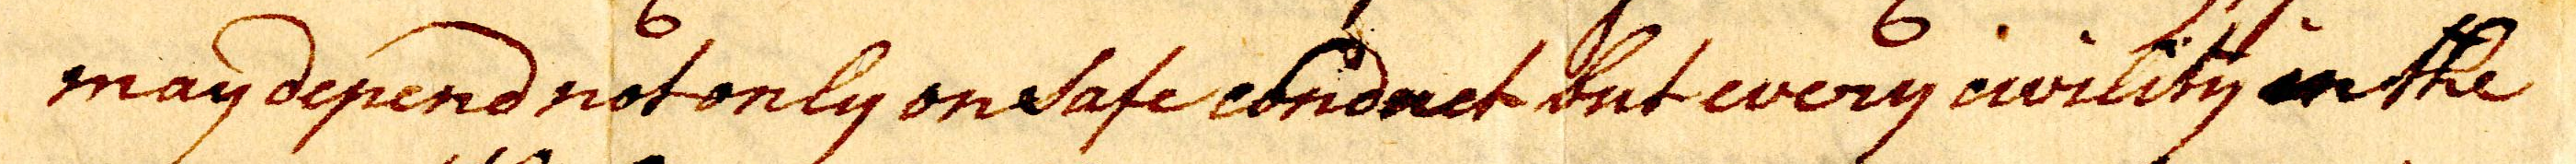may depend not only on safe conduct but every civility in the
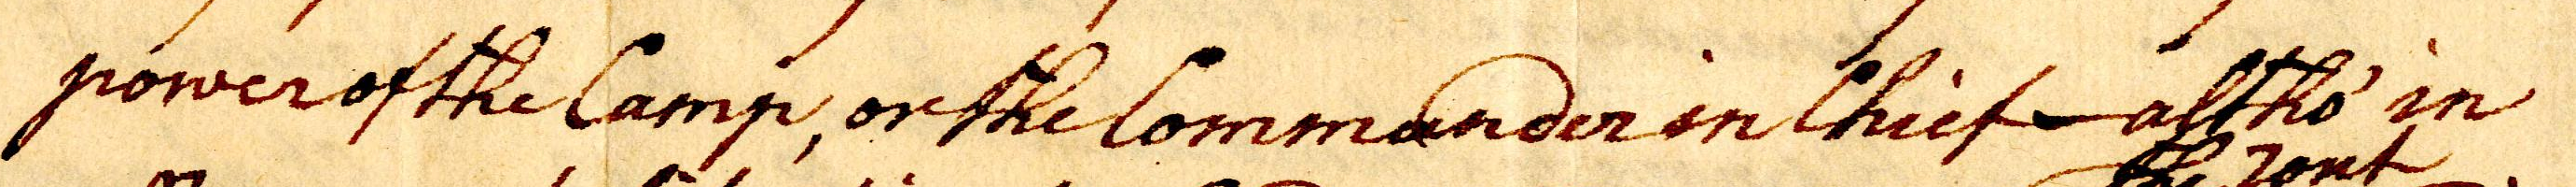power of the Camp, or the Commander in Chief- altho' in
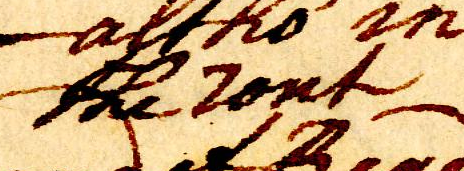the ront
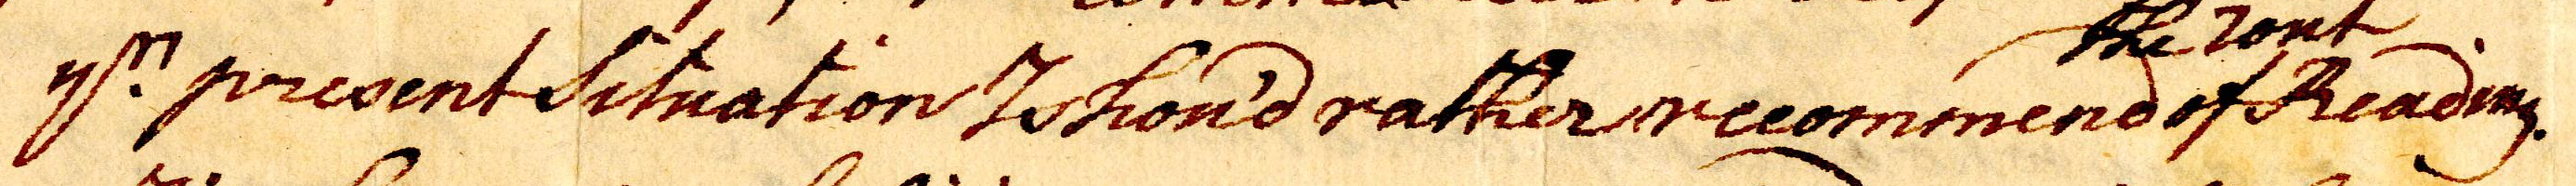y^r. present Situation I shou'd rather recommend of Reading.
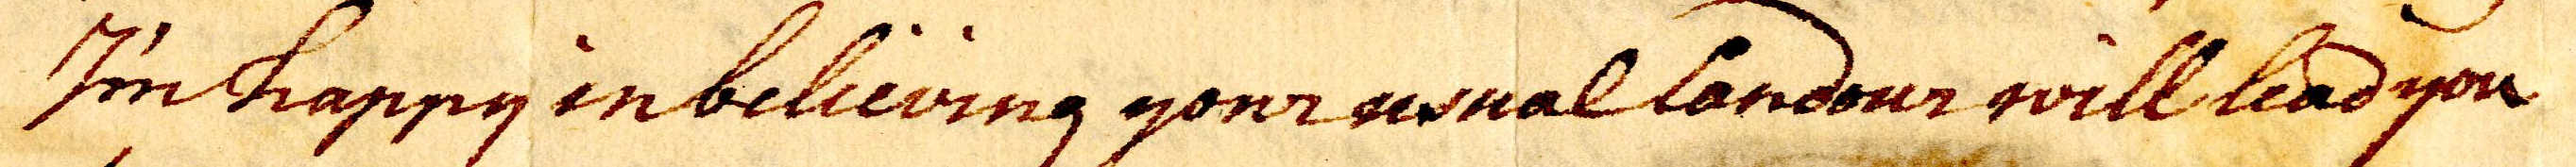I'm happy in believing your usual Candour will lead you
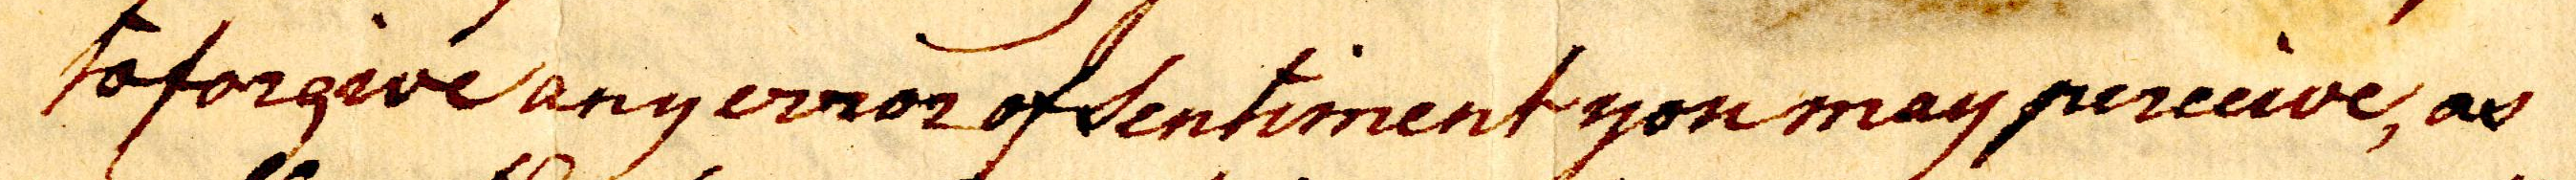to forgive any error of sentiment you may perceive, as
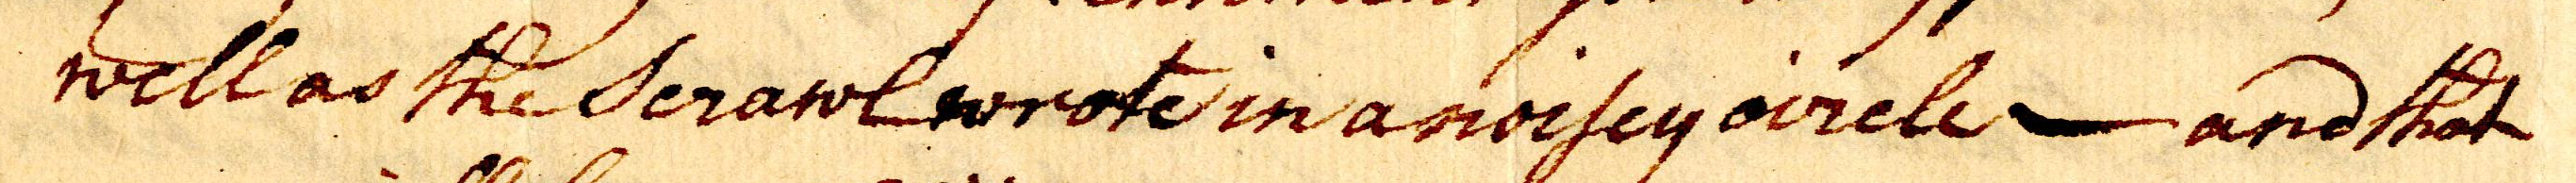well as the Scrawl wrote in a noisey oirele- and that
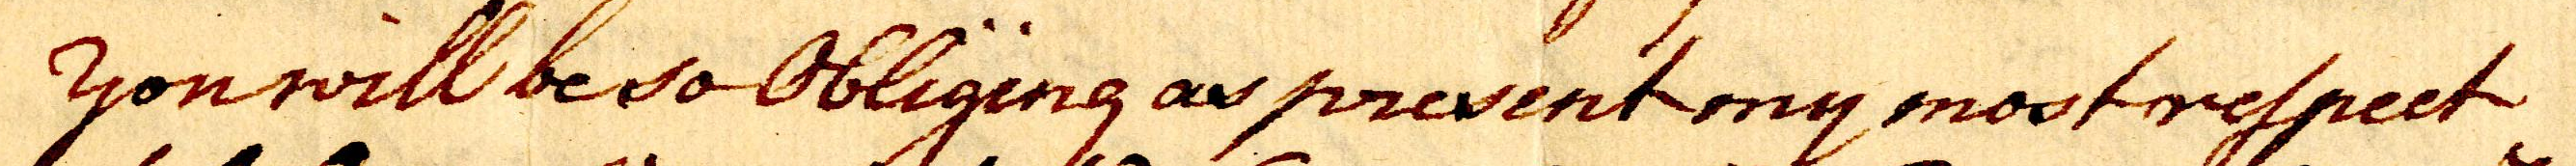you will be so Obliging as present my most respect
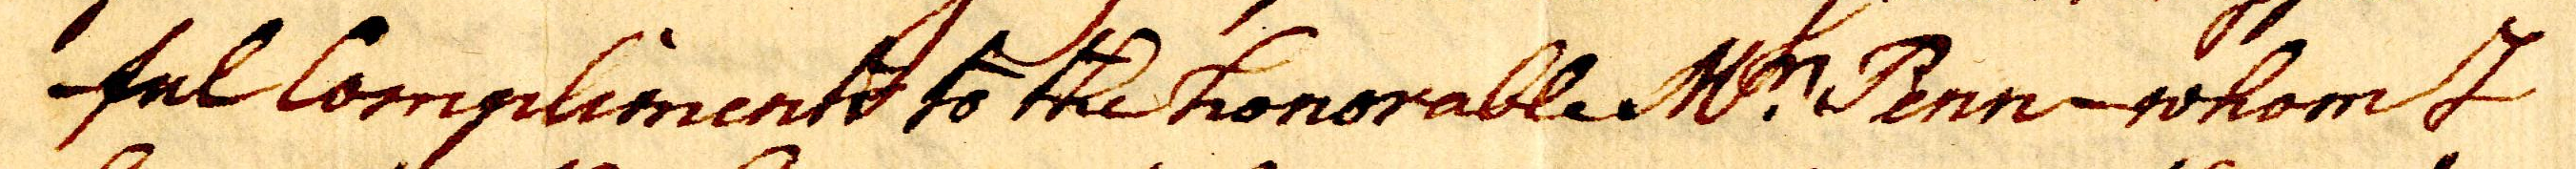-ful Compliments to the honorable M^r. Penn- whom I
